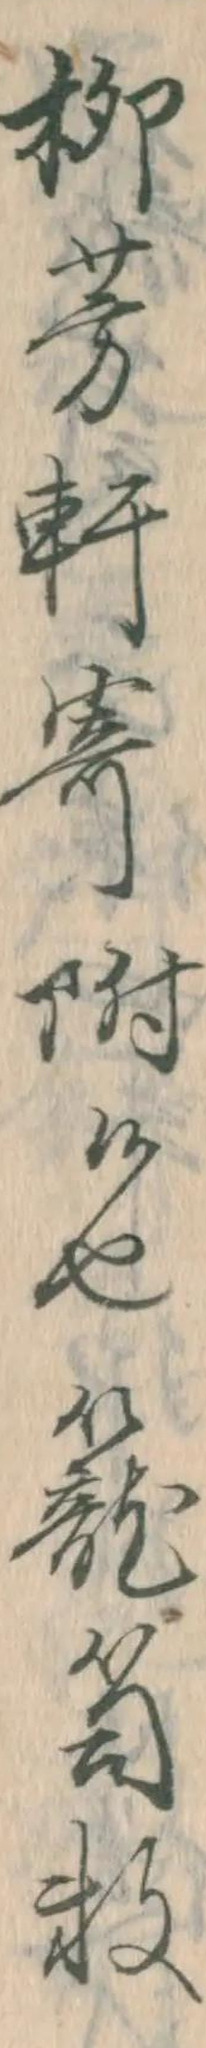柳芳軒寄附候也籠笥数
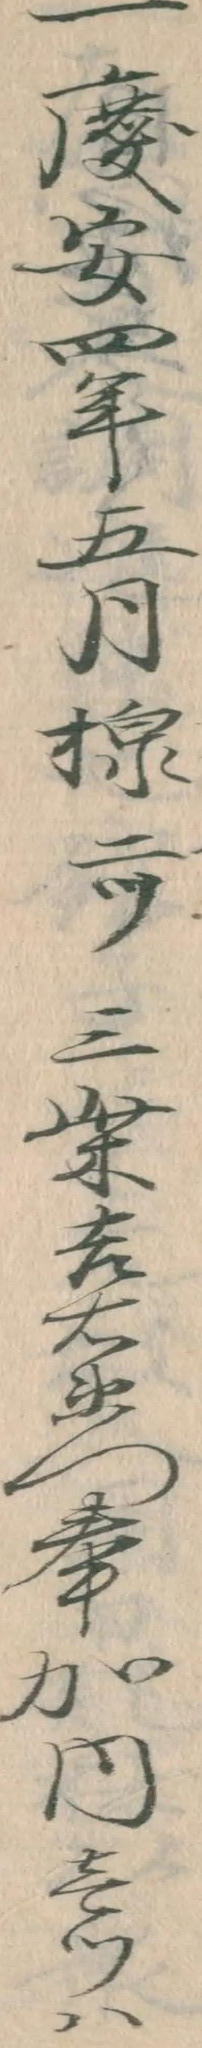一慶安四年五月楾二ツ三柴吉右衛門奉加内壱ツハ
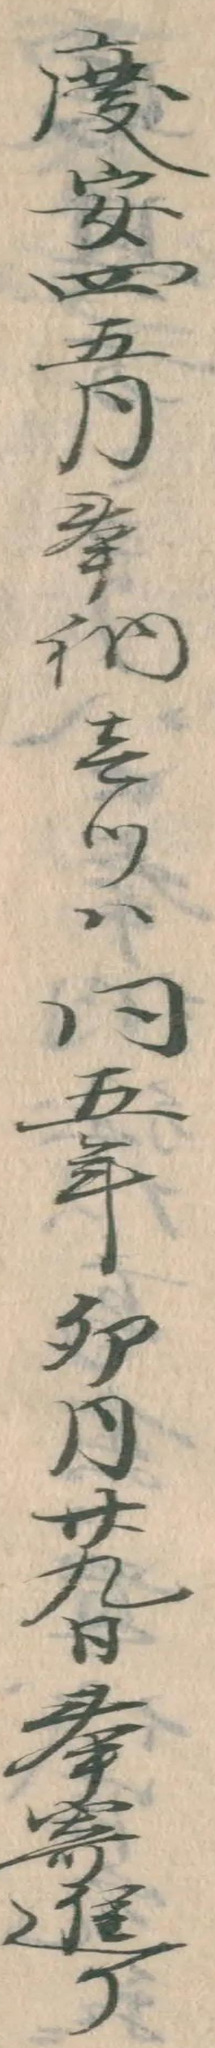慶安四五月奉納壱ツハ同五年卯月廿九日奉寄進り
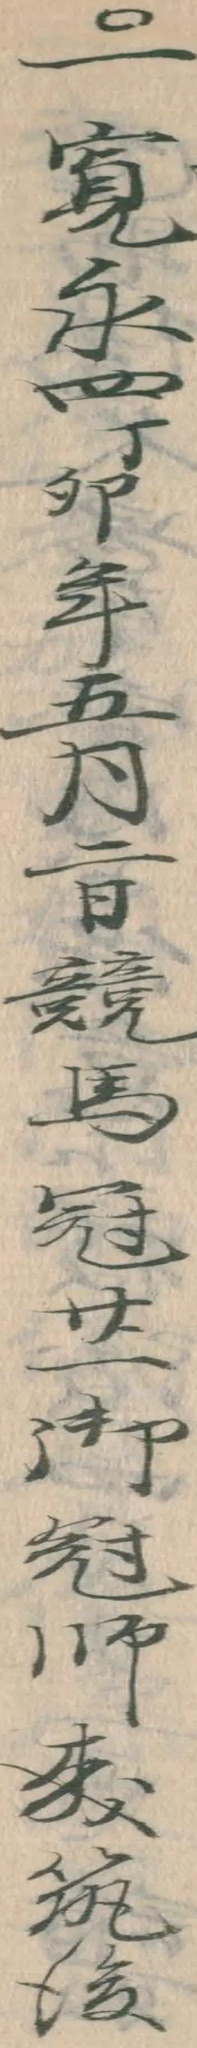○一寛永四丁卯年五月二日競馬冠廿一御冠師森筑後
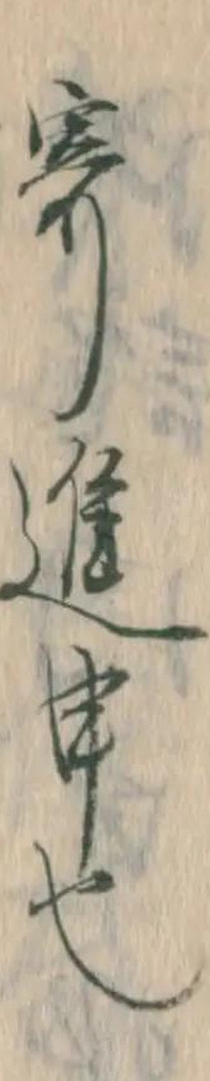寄進申也
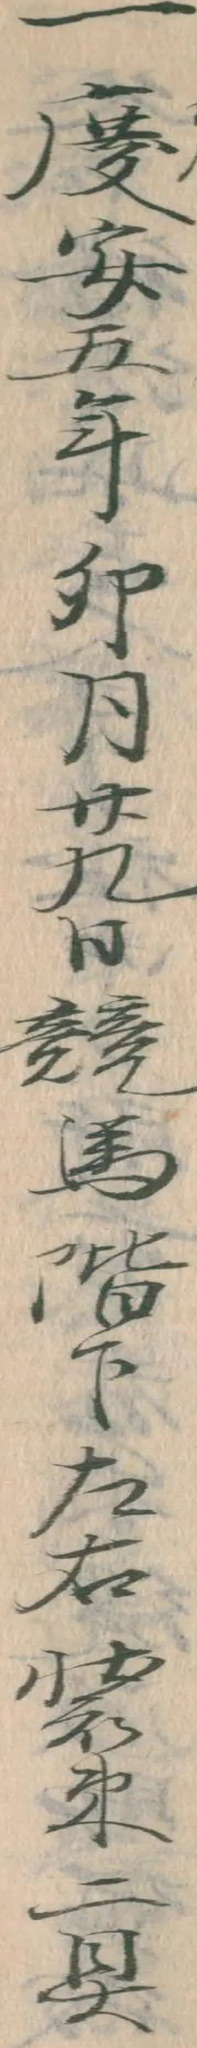一慶安五年卯月廿九日競馬階下左右装束二具
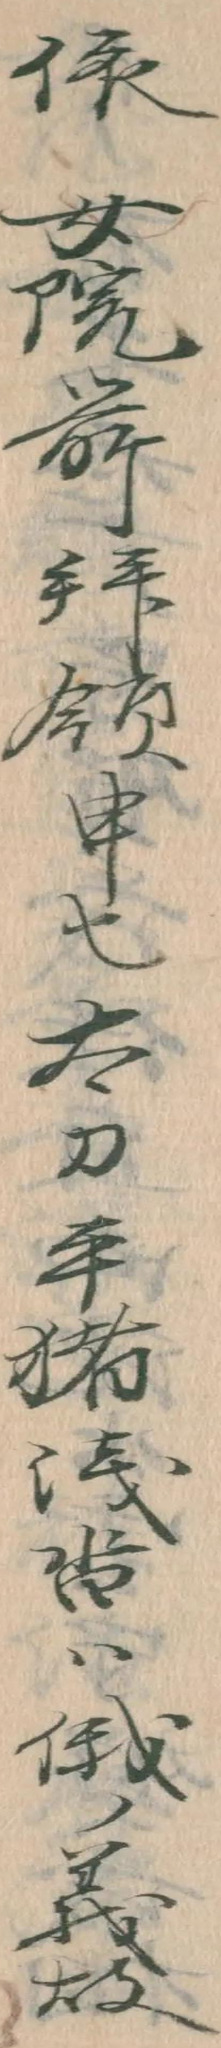依女院御所拝領申也太刀本猪浅沓ハ俄ノ義故
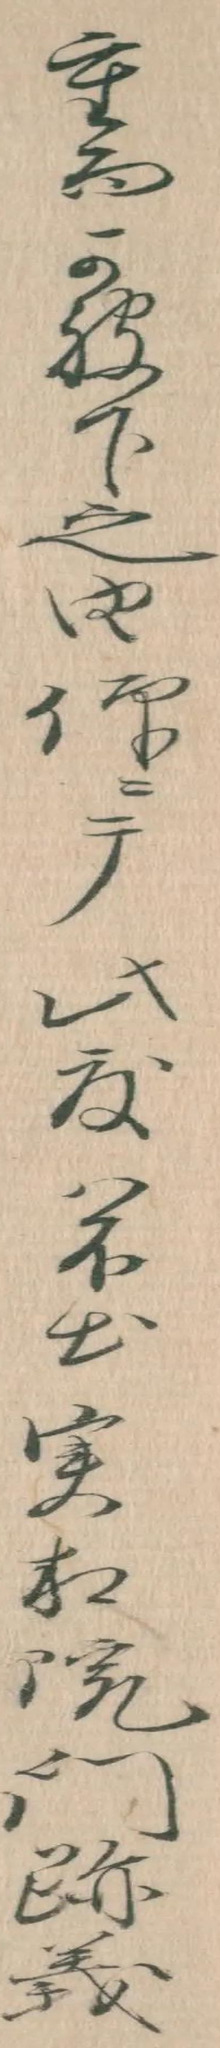重而可被下之由仰ニテ此度ハ不出実相院門跡義
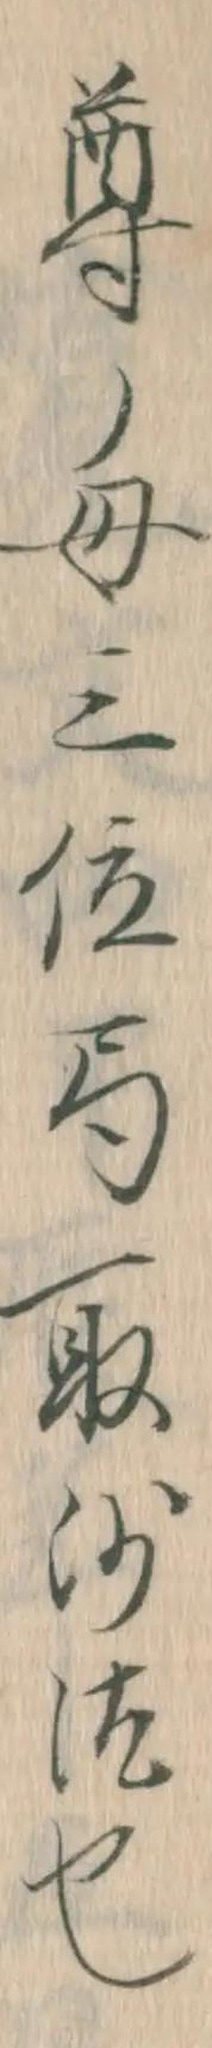尊ノ母三位局取沙汰也
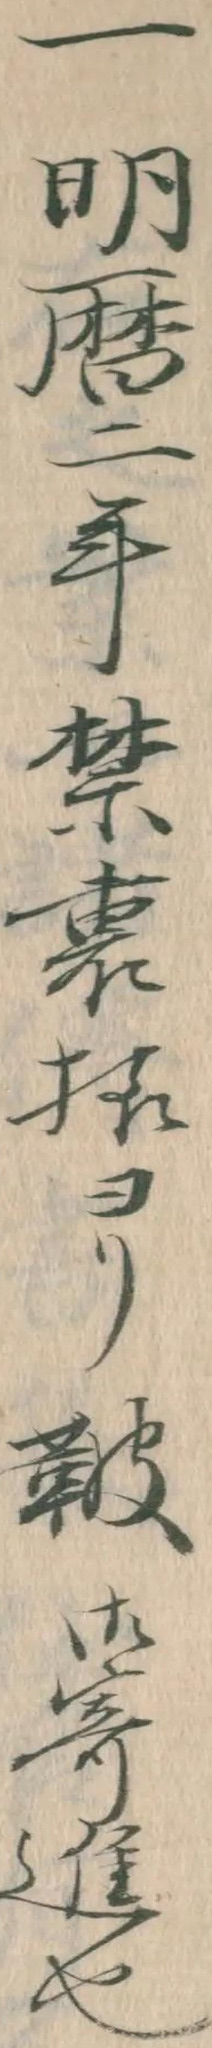一明暦二年禁裏様ヨリ鞁御寄進也
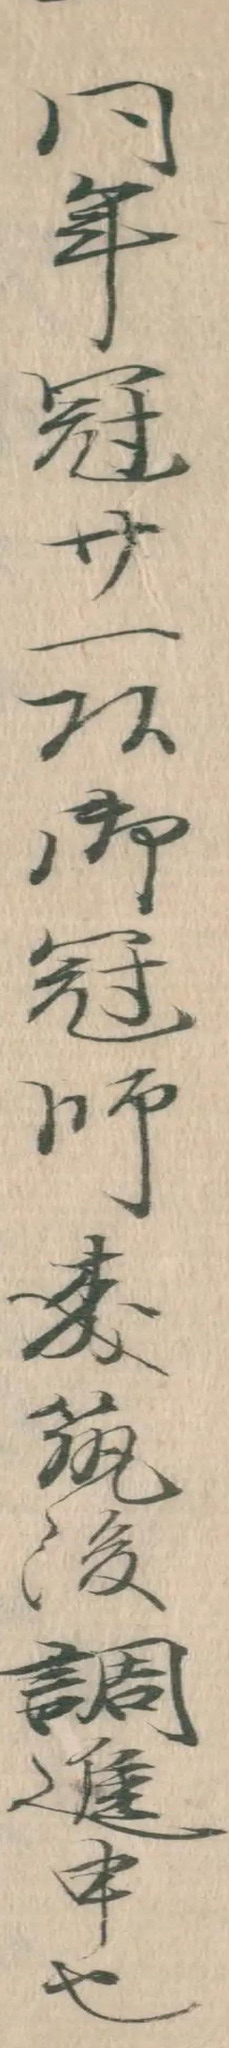一同年冠廿一頭御冠師森筑後調進申也
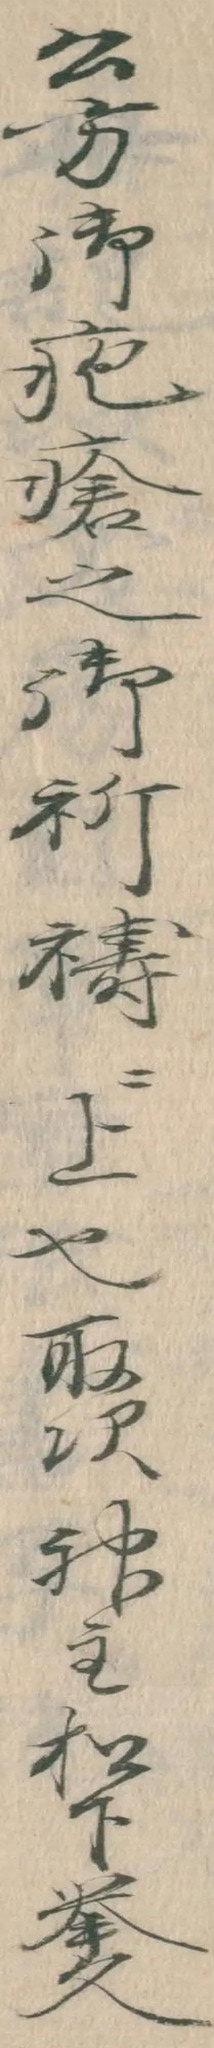公方御疱瘡之御祈祷ニ上也取次神主松下挙久

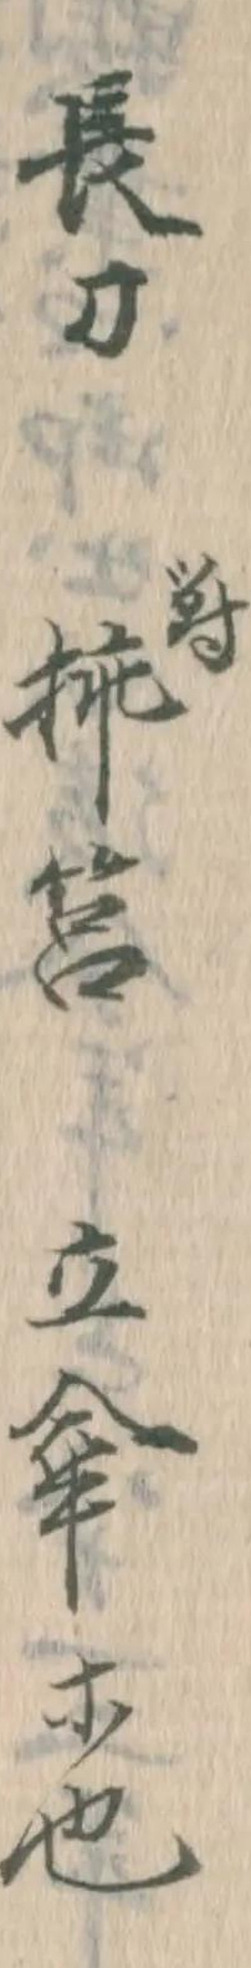長刀挿筥立傘等也
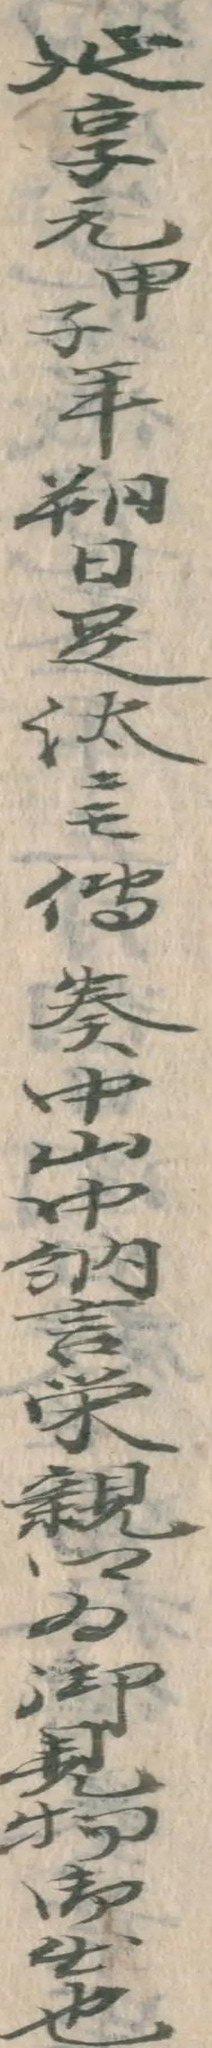延享元甲子年朔日足汰ニモ伝奏中山中納言栄親卿為御見物御出也
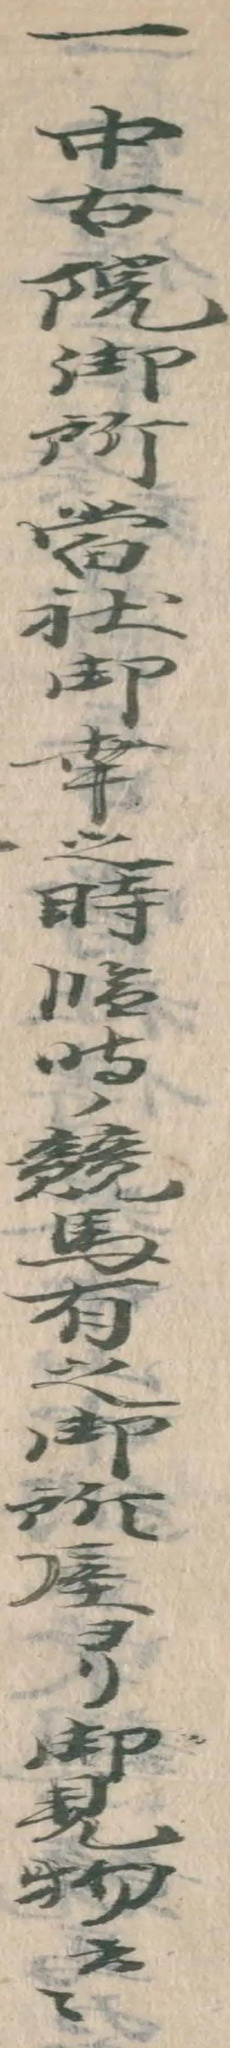一中右院御所当社御幸之時臨時ノ競馬有之御所屋ヨリ御見物云々
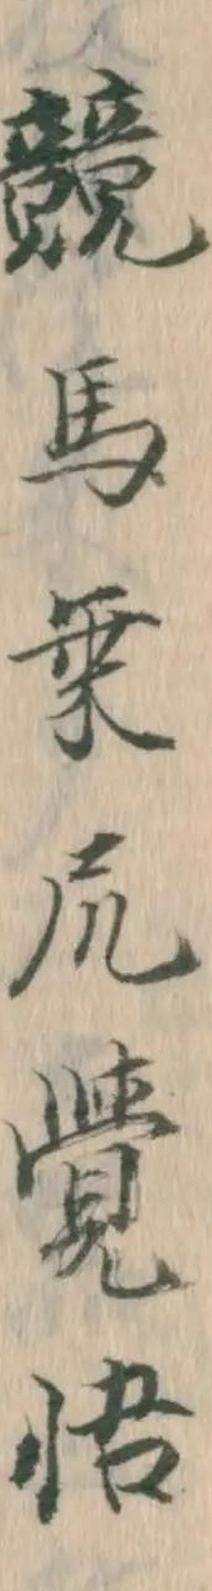競馬乗尻覚悟
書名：賀茂社記録. 第11冊
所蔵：国立国会図書館 National Diet Library, JAPAN
